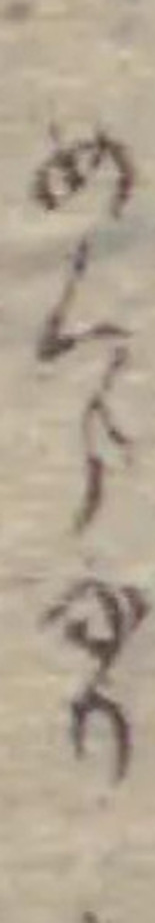めくらなり
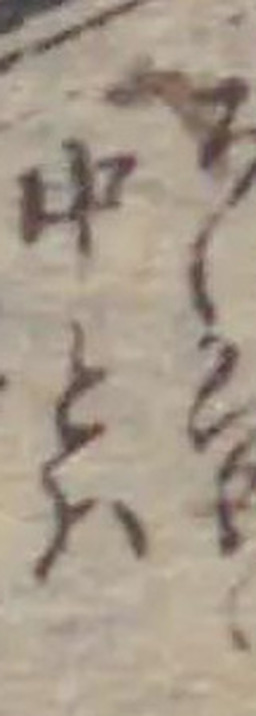中とは
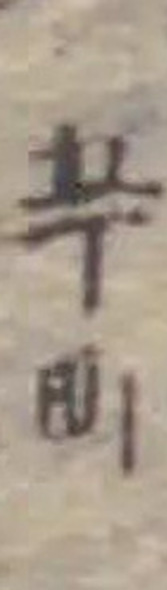五丁町
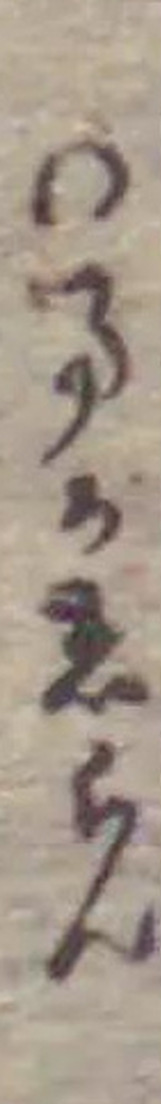の事かしらん
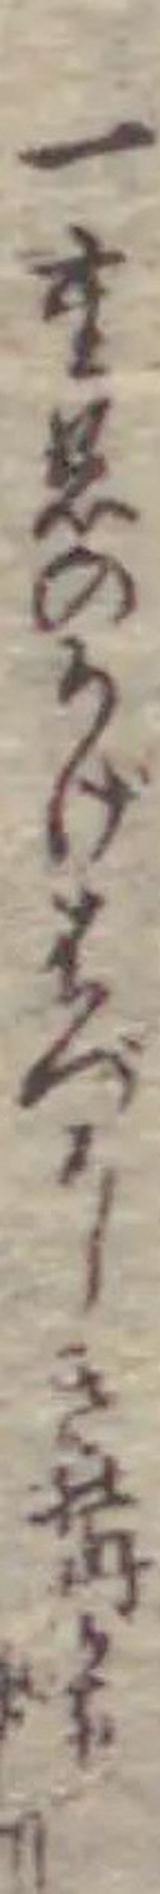一重着のかげはづかしき牡丹かな
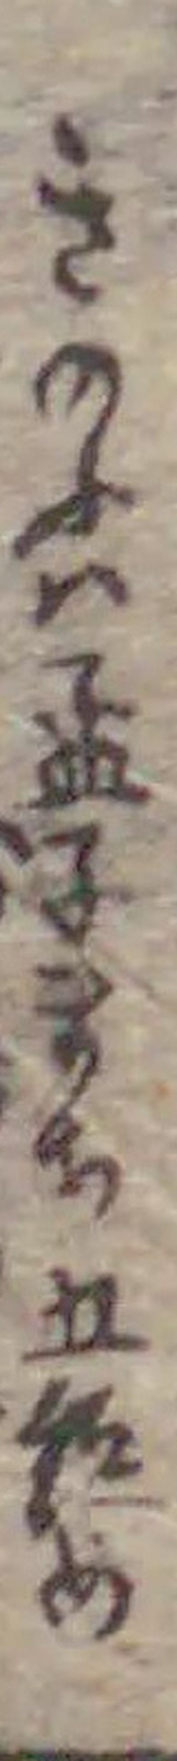きのふは孟子まち五経め
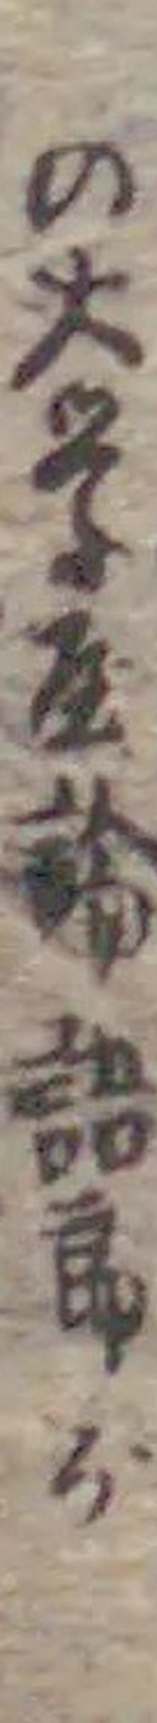の大学屋論語郎が
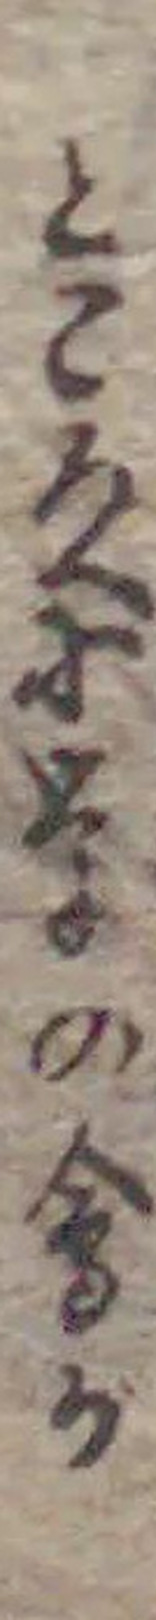ところへ小学の会が
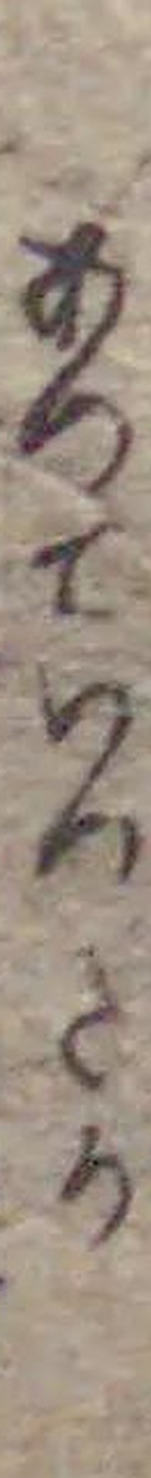あつていつたか
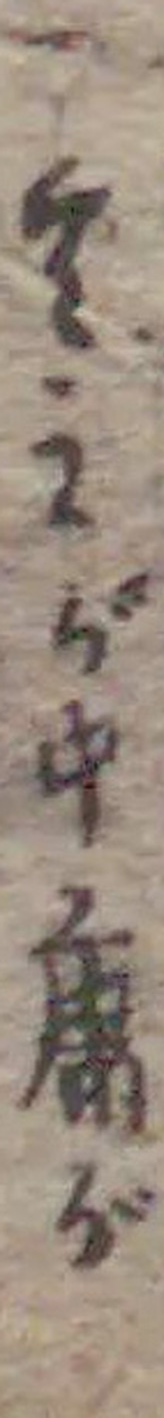其主が中庸が
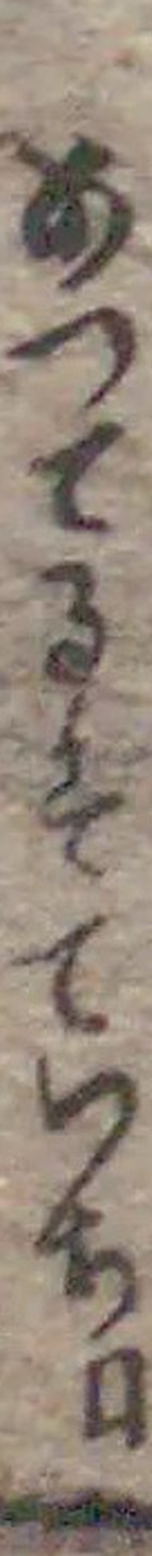あつてるすていち
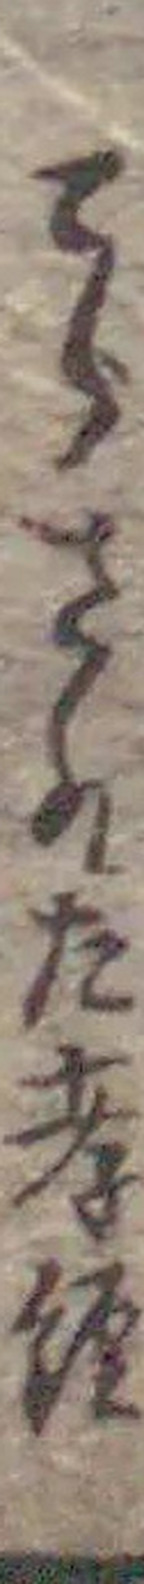てらされた孝経
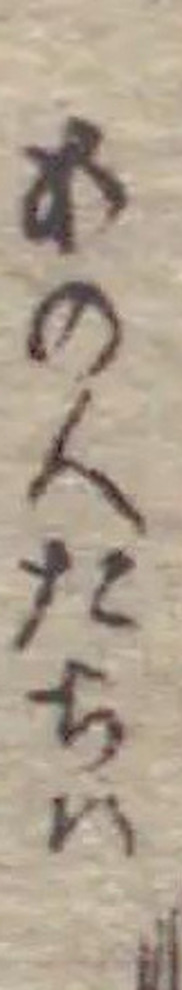あの人たちは
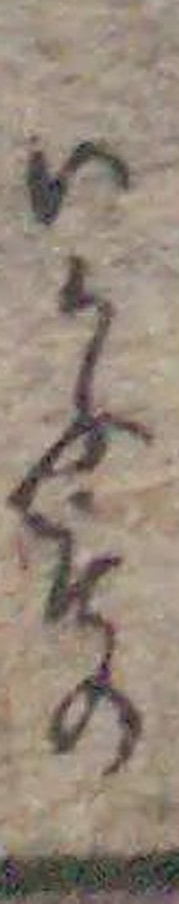いかふその
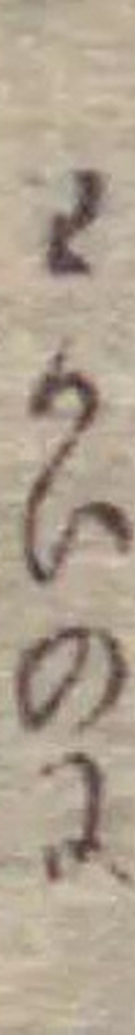わかいのに
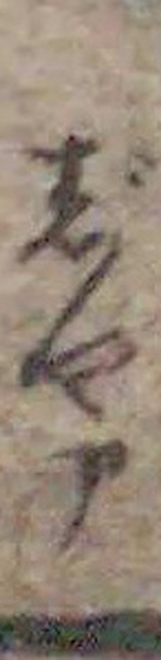じやア
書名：栄増眼鏡徳 3巻
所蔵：国立国会図書館 National Diet Library, JAPAN
